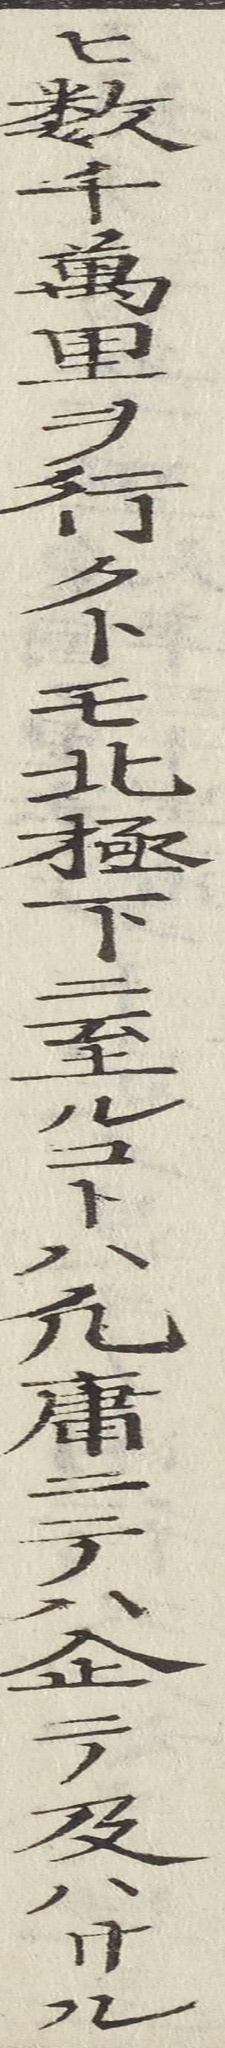ヒ数千万里ヲ行クトモ北極下ニ至ルコトハ凡庸ニテハ企テ及ハサル
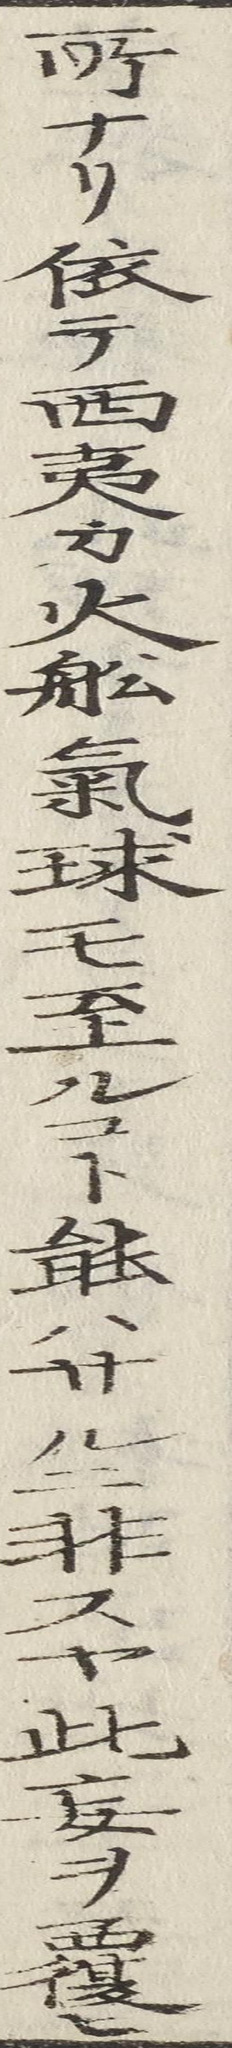所ナリ依テ西夷カ火船気球モ至ルコト能ハサルニ非スヤ此妄ヲ覆ヒ
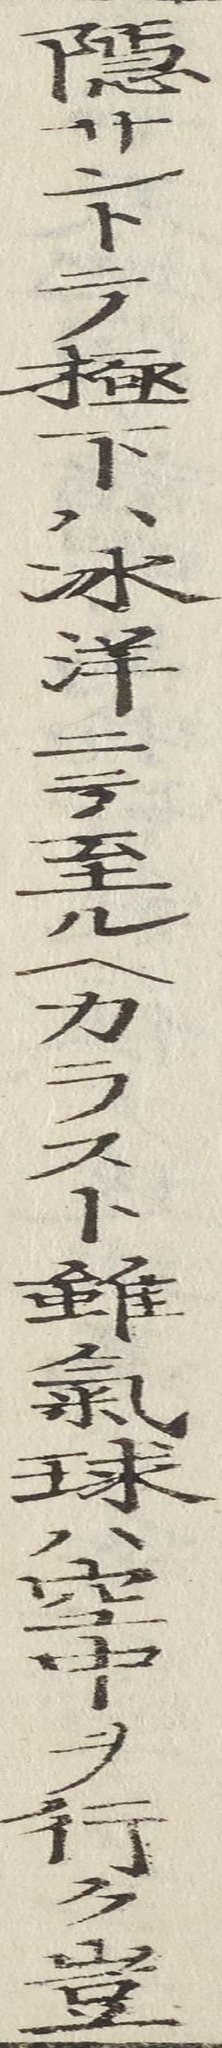隠サントテ極下ハ冰洋ニテ至ルヘカラスト雖気球ハ空中ヲ行ク豈
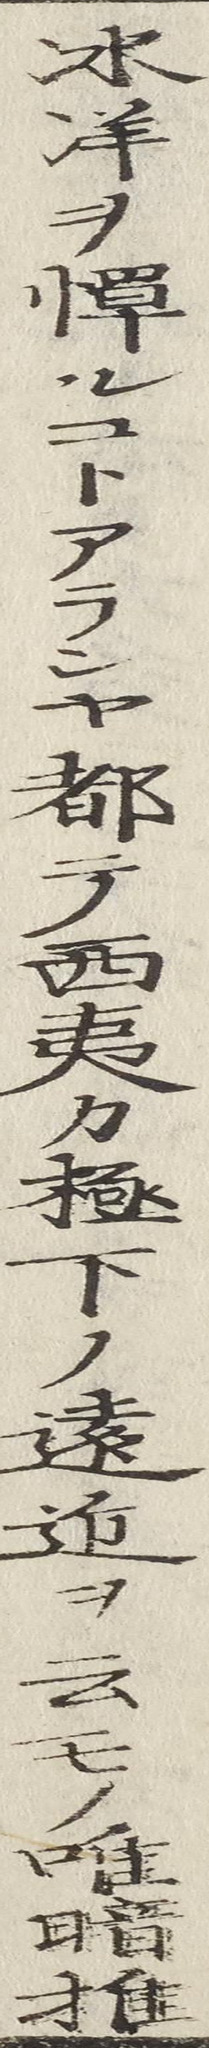冰洋ヲ憚ルコトアランヤ都テ西夷カ極下ノ遠近ヲ云モノ唯暗推
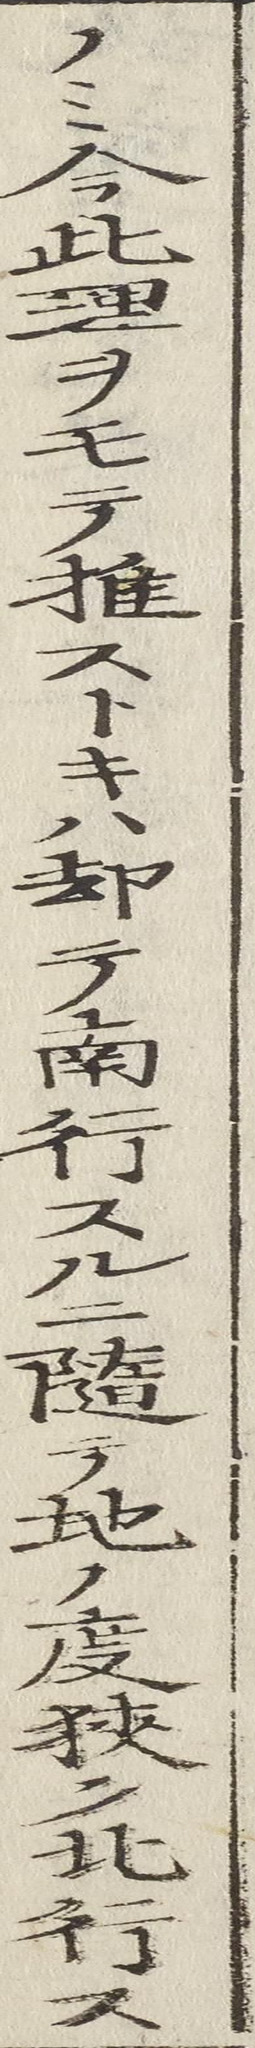ノミ今此理ヲモテ推ストキハ却テ南行スルニ随テ地ノ度狭ク北行ス
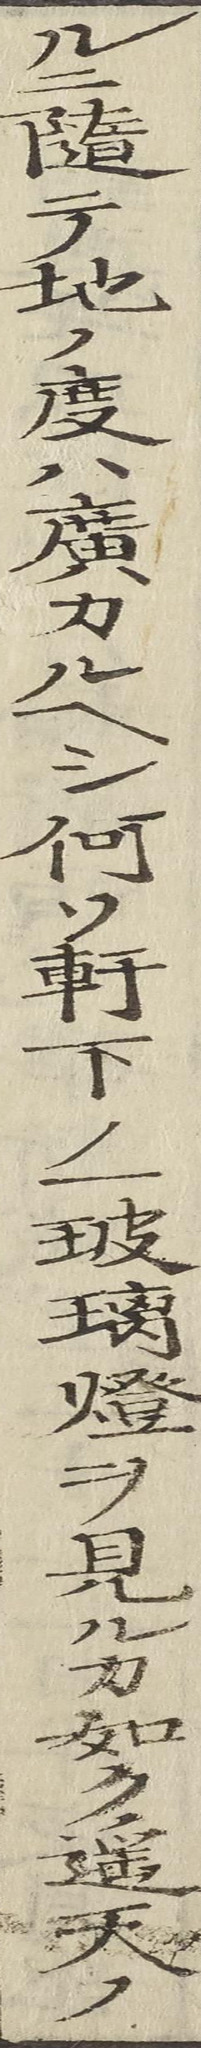ルニ随テ地ノ度ハ広カルヘシ何ソ軒下ノ一玻璃燈ヲ見ルカ如ク遥天ノ
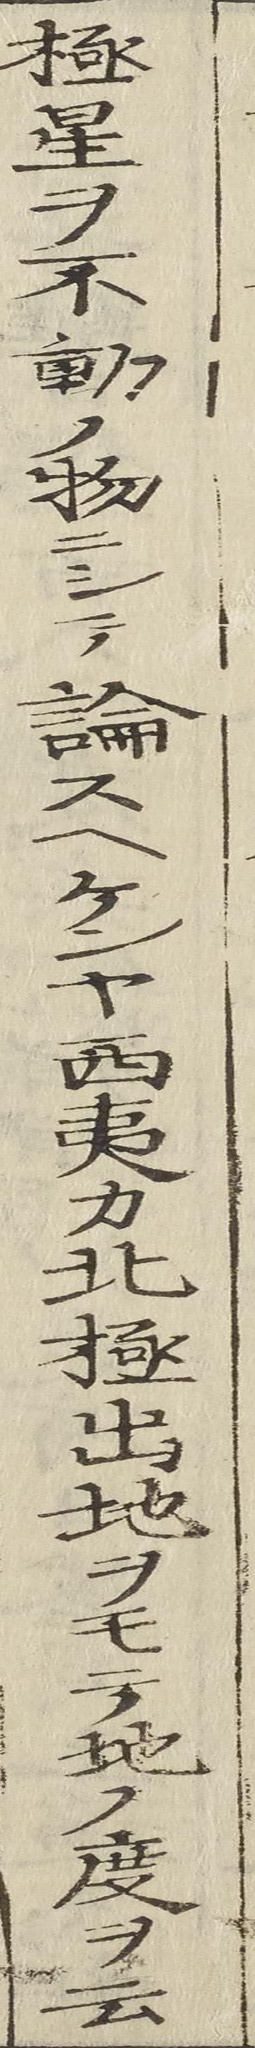極星ヲ不動ノ物ニシテ論スヘケンヤ西夷カ北極出地ヲモテ地ノ度ヲ云
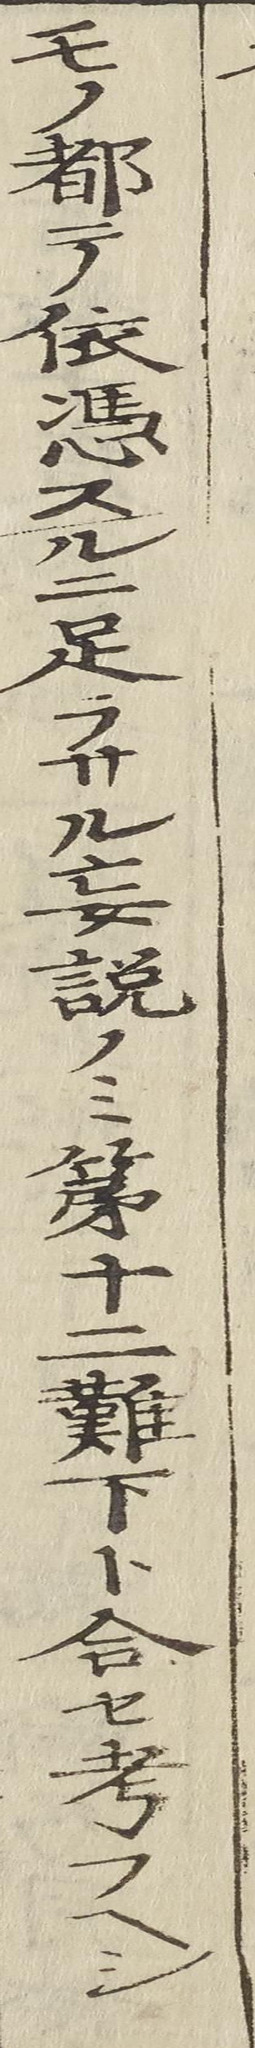モノ都テ依慿スルニ足ラサル妄説ノミ第十二難下ト合セ考フヘシ
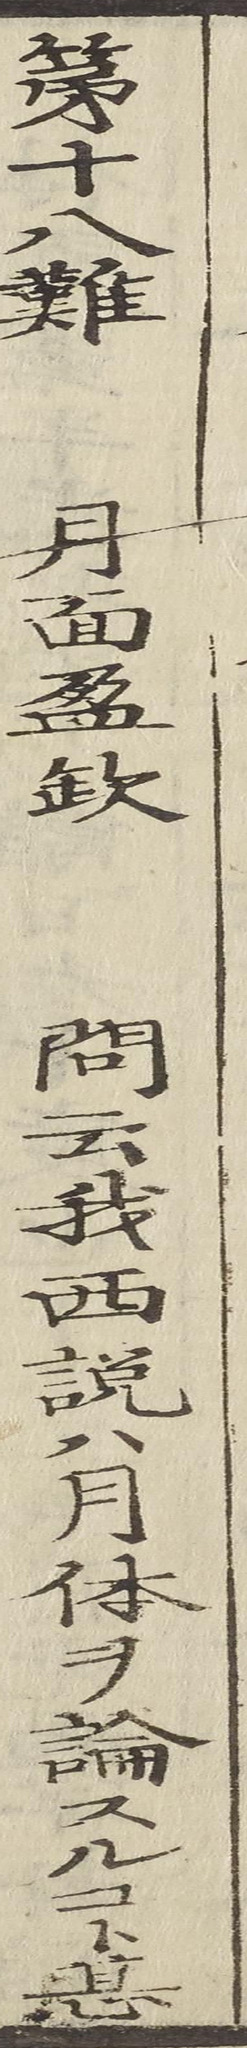第十八難月面盈欫問云我西説ハ月体ヲ論スルコト甚
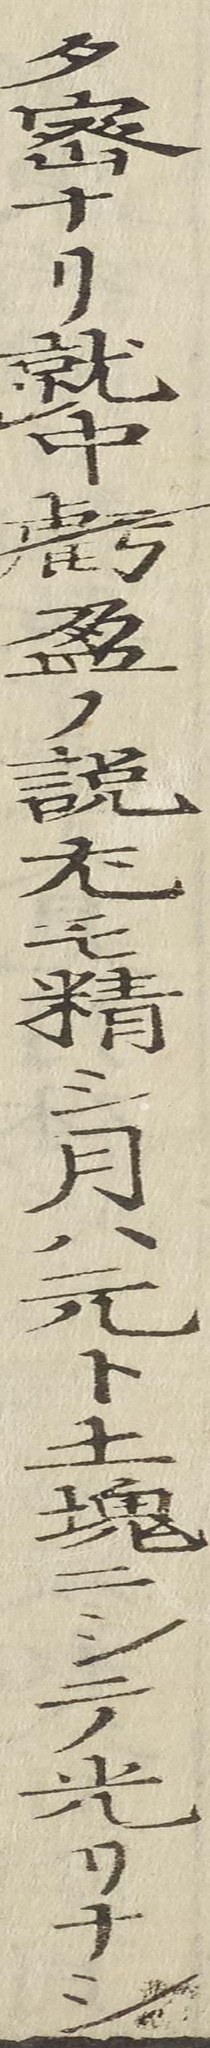タ蜜ナリ就中虧盈ノ説尤モ精シ月ハ元ト土塊ニシテ光リナシ

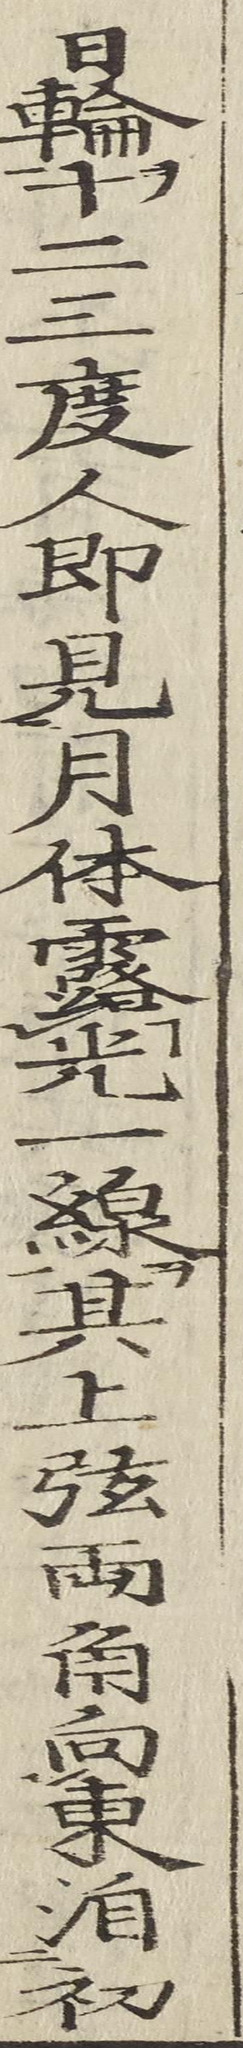日輪十二三度人即見ニ月体露光一線其上弦両角向東泊ニ初
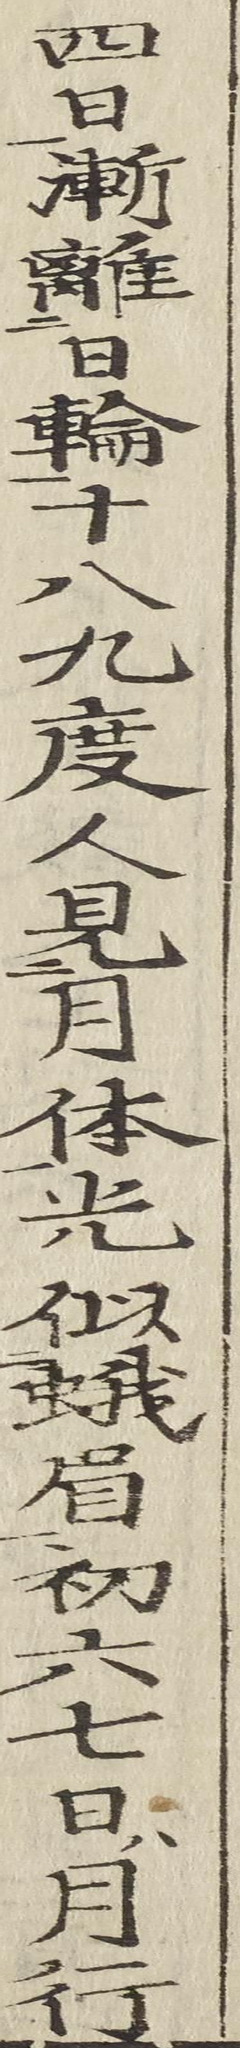四日漸離ニ日輪十八九度人見ニ月体光似ニ蛾眉初六七日月行
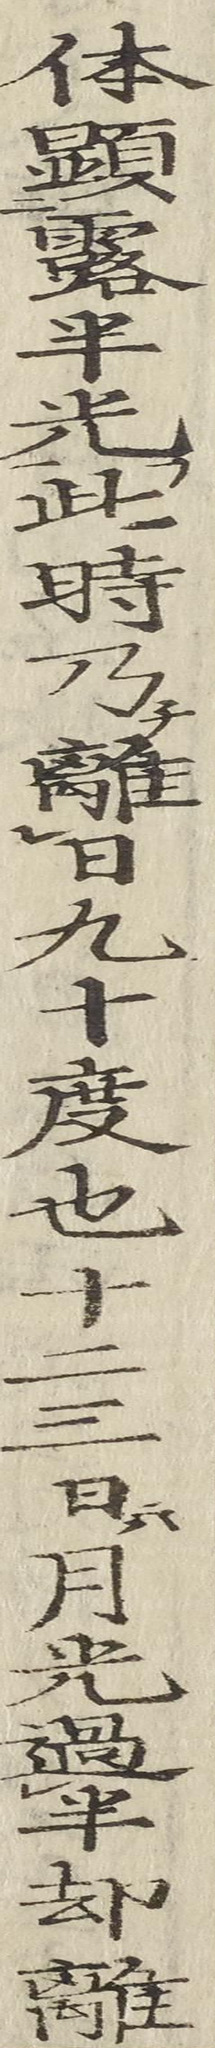体顕ニ露半光此時乃離日九十度也十二三日月光過半却離
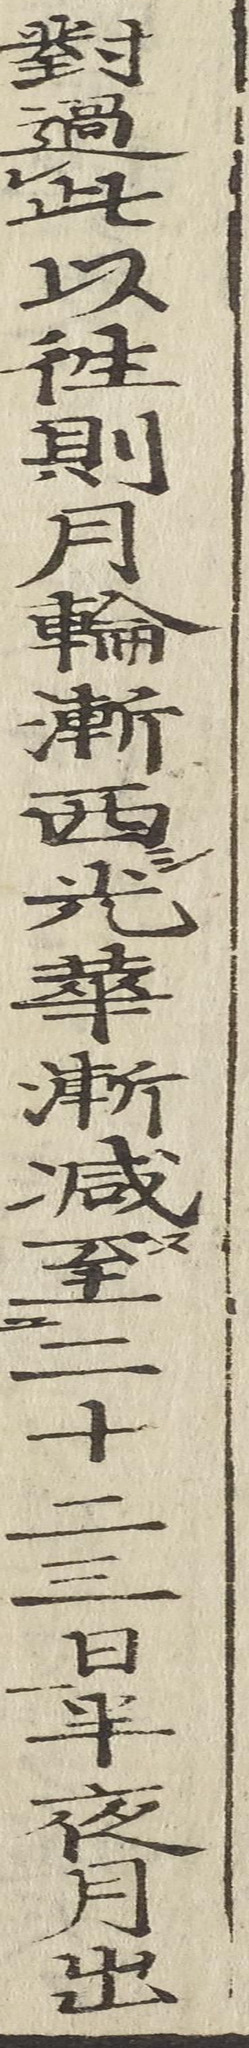対過此以往則月輪漸西光萃漸減至ニ二十二三日半夜月出
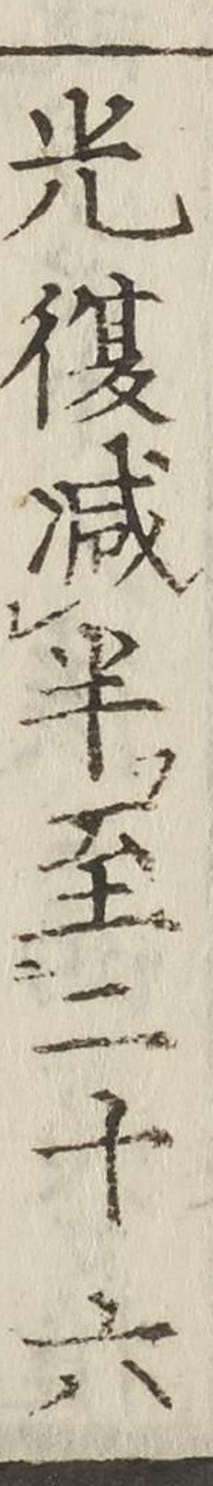光復減半至ニ二十六
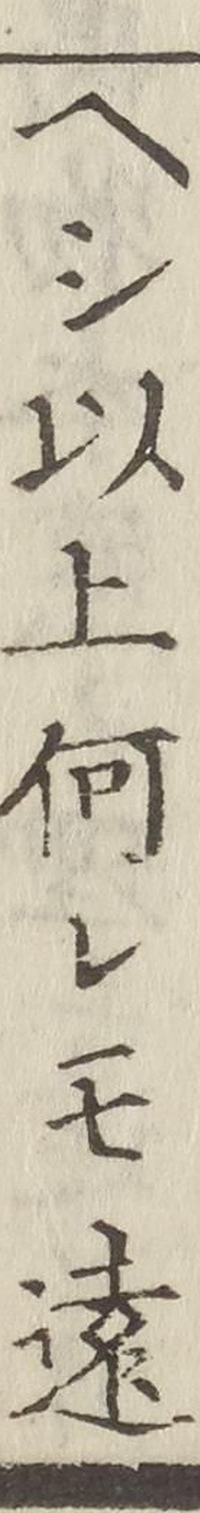ヘシ以上何レモ遠
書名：護法新論　二編　中
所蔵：東京大学地震研究所図書室 Earthquake Research Institute Library, The University of Tokyo, JAPAN
